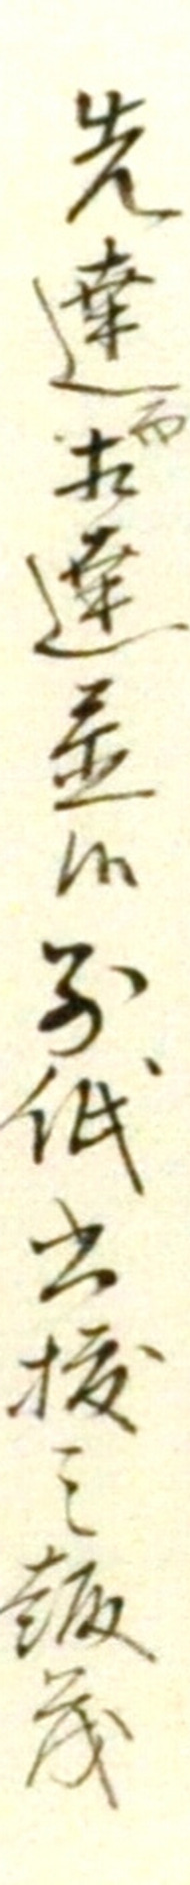先達而相達置候別紙書抜之趣茂
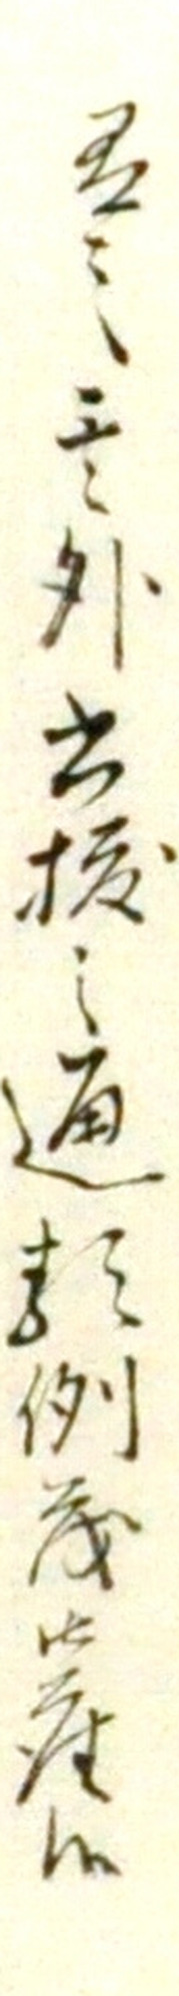有之其外書抜之通類例茂御座候
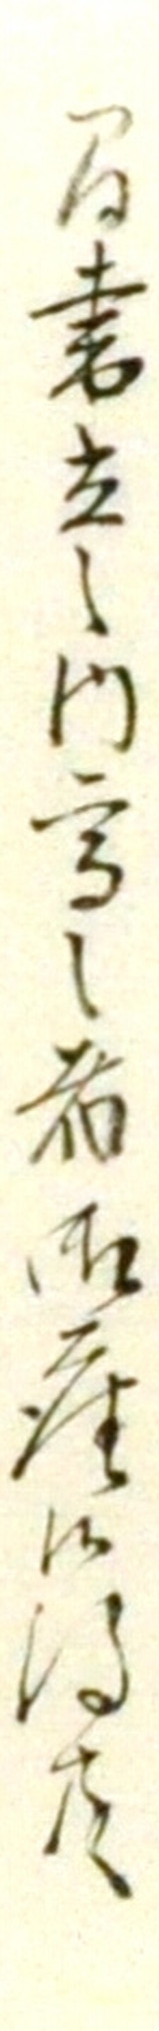間書立之内高之者御座候得共
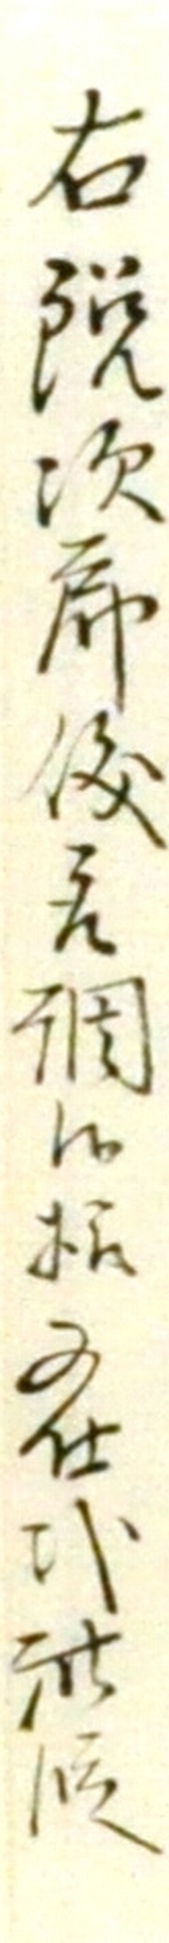右鋭治郎儀取調候様不仕哉此段
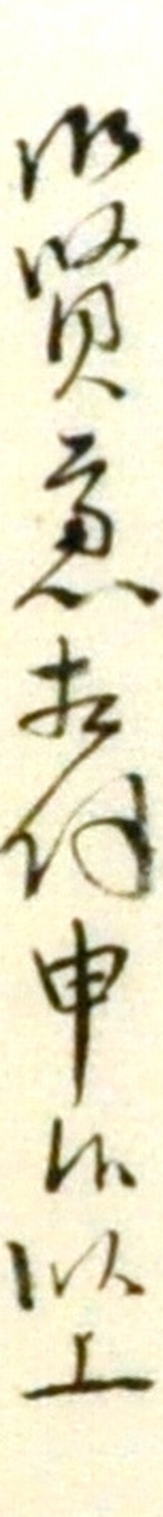御賢慮相伺申候以上
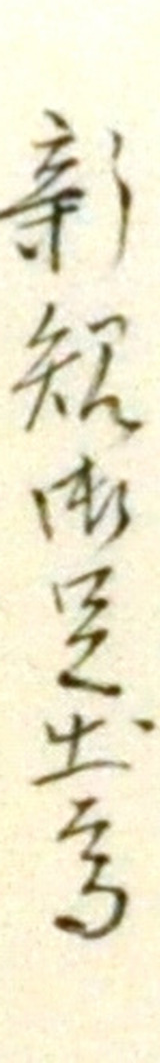新規御足出高
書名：下案・西丸火之番調
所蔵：伊那市立高遠町図書館・合同会社AMANE
